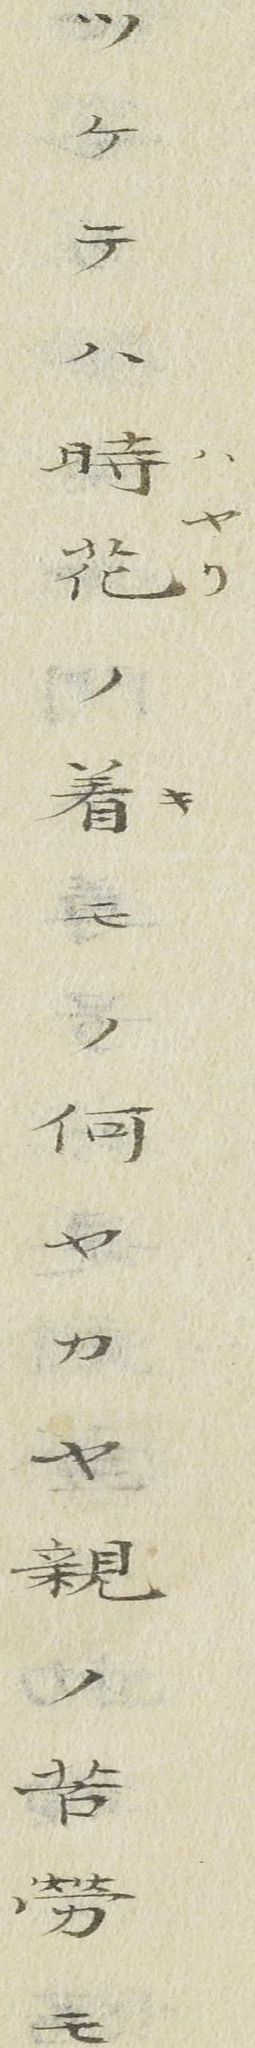ツケテハ時花ノ着モノ何ヤカヤ親ノ苦労モ
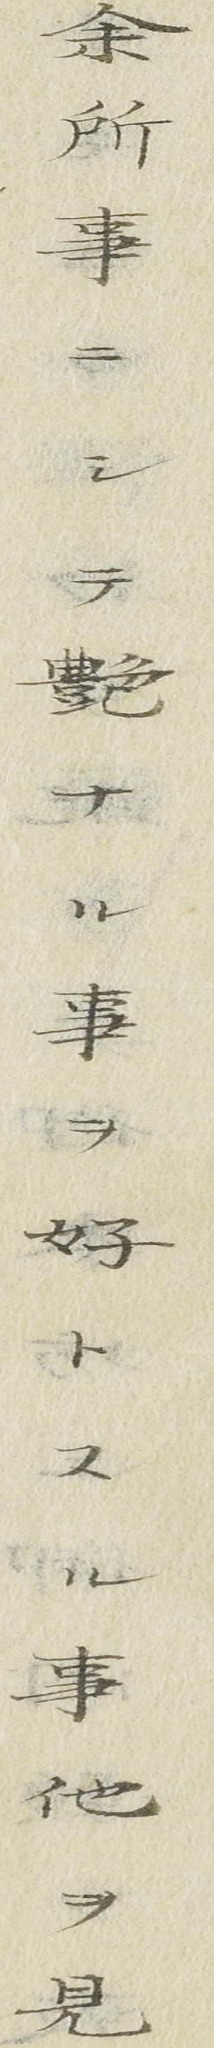余所事ニシテ艶ナル事ヲ好トスル事他ヲ見
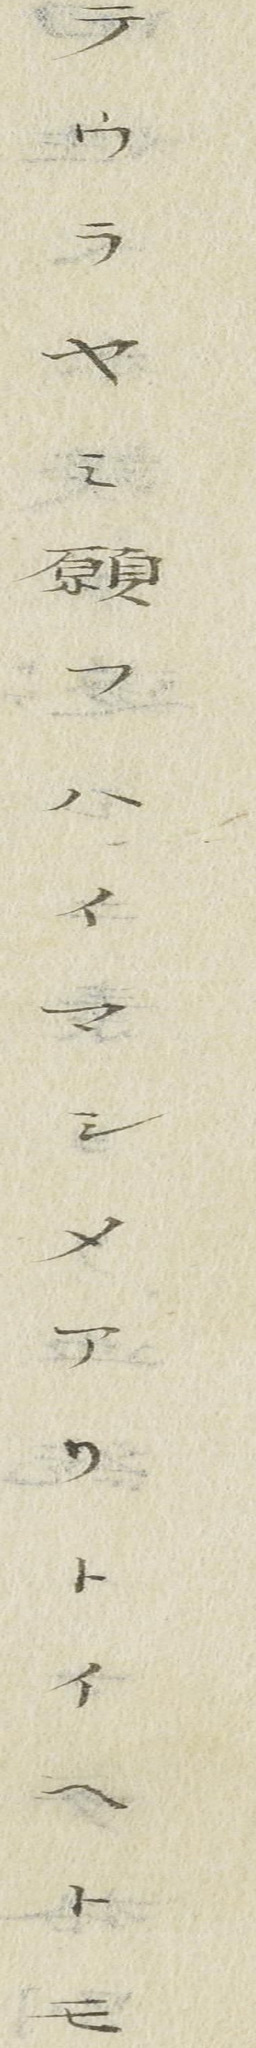テウラヤミ願フハイマシメアリトイヘトモ
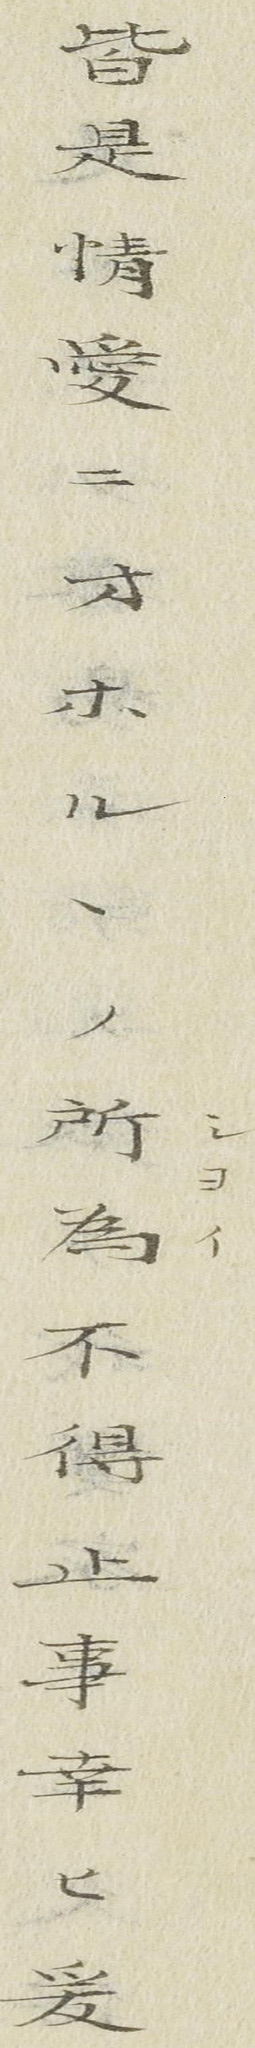皆是情愛ニオホルヽノ所為不得止事幸ヒ爰
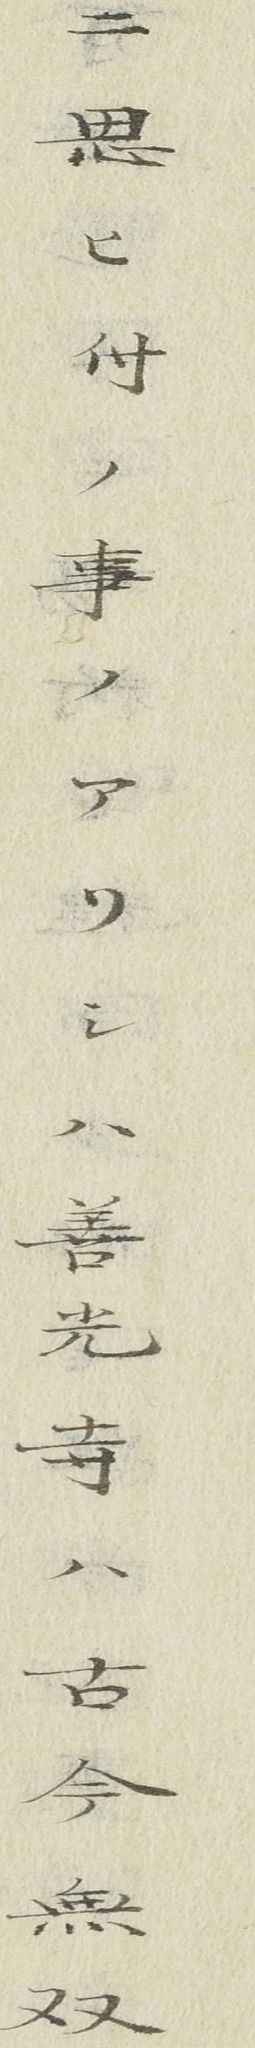ニ思ヒ付ノ事ノアリシハ善光寺ハ古今無双
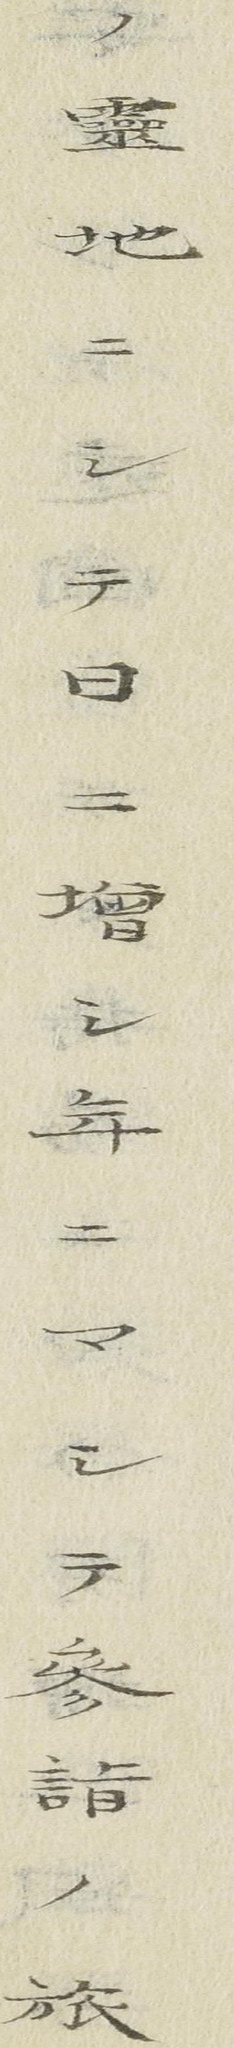ノ霊地ニシテ日ニ増シ年ニマシテ参詣ノ旅
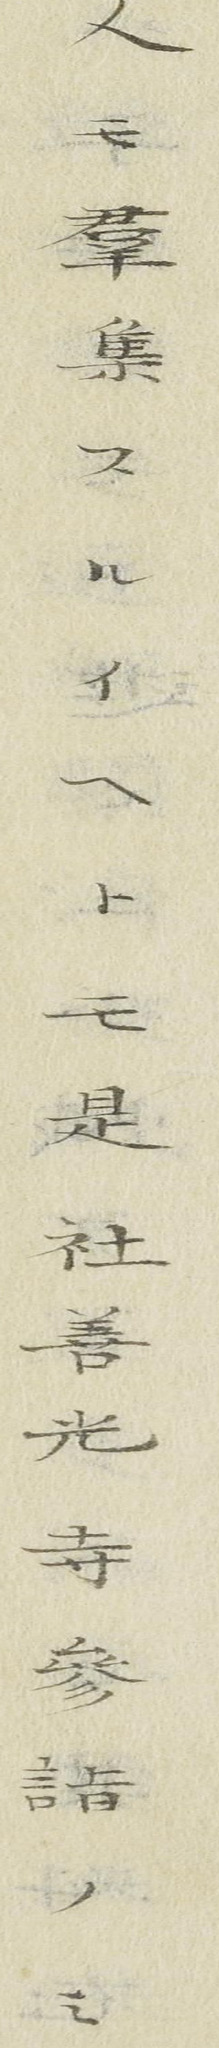人モ群集スルイヘトモ是社善光寺参詣ノミ
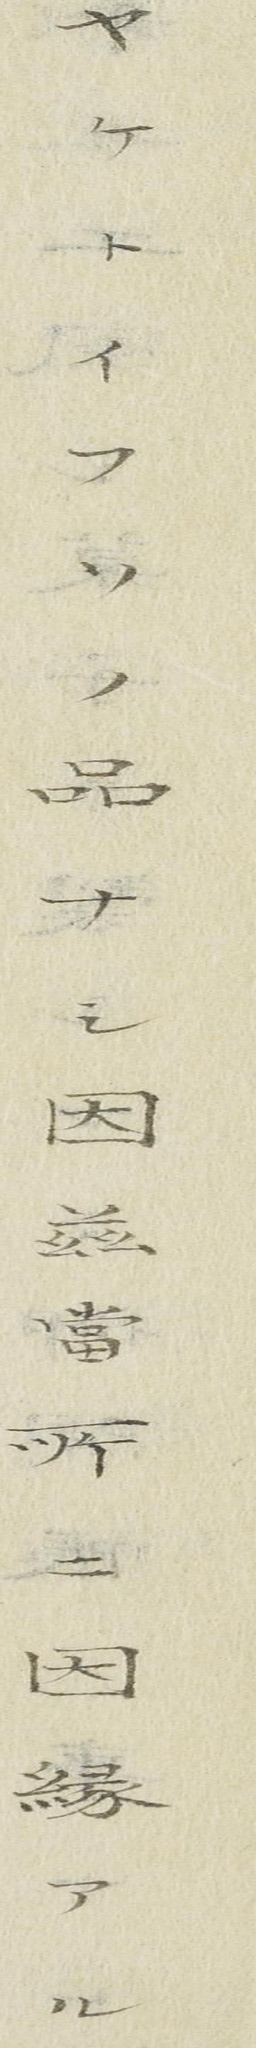ヤケトイフソノ品ナシ因茲当所ニ因縁アル

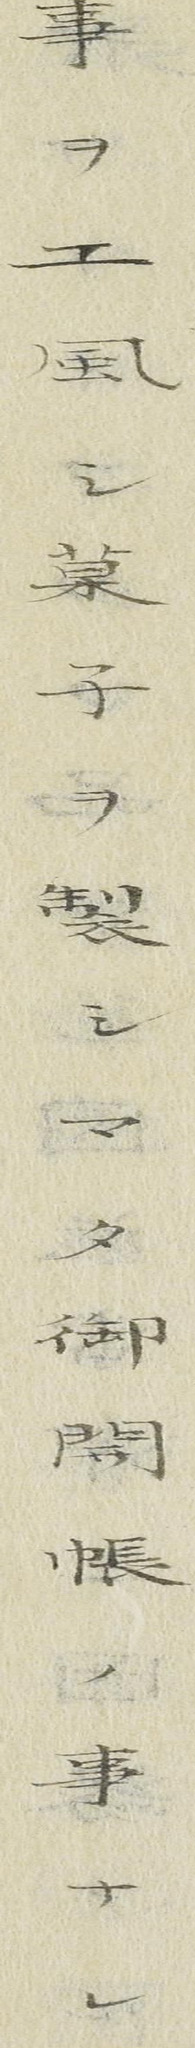事ヲ工風シ菓子ヲ製シマタ御開帳ノ事ナレ
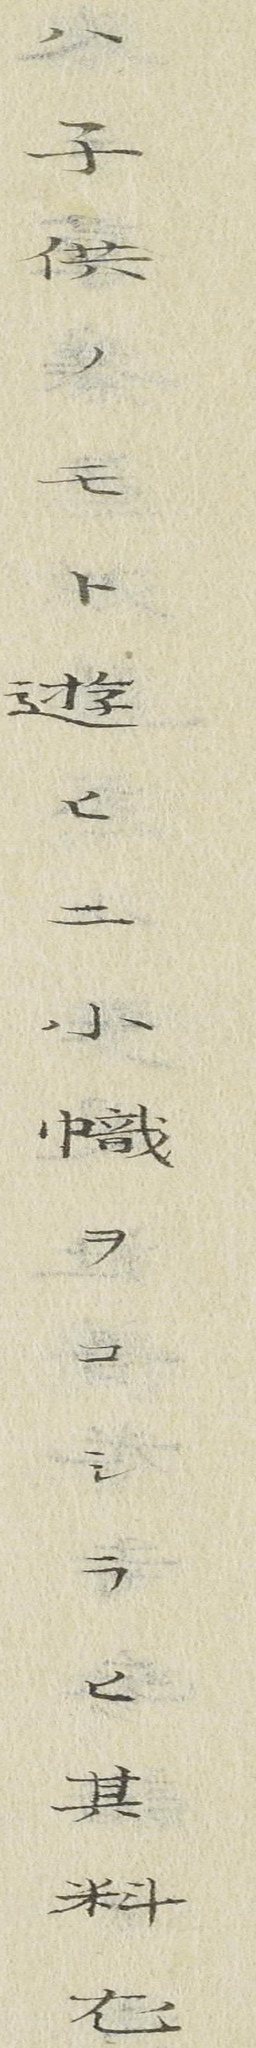ハ子供ノモト遊ヒニ小幟ヲコシラヒ其料左
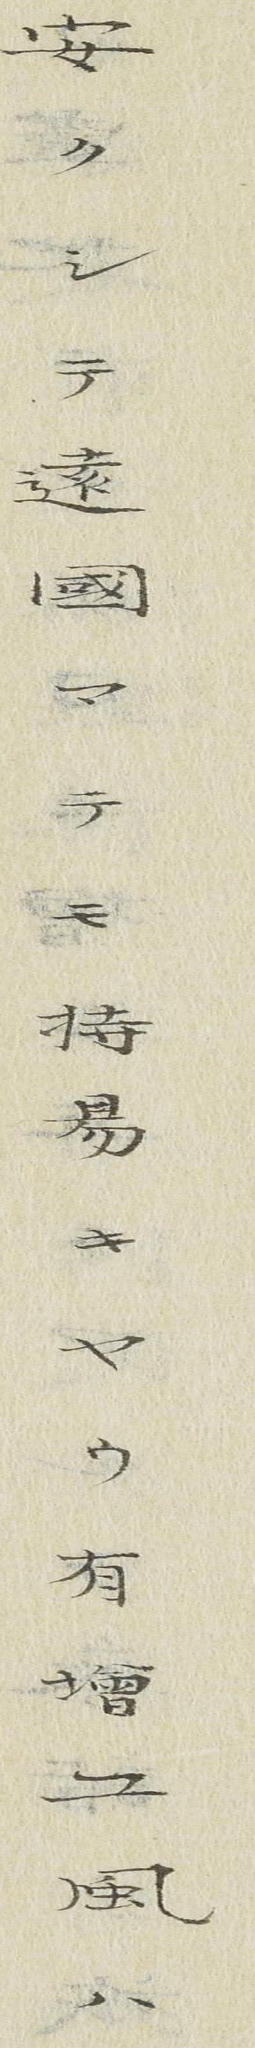安クシテ遠国マテモ持易キヤウ有増工風ハ
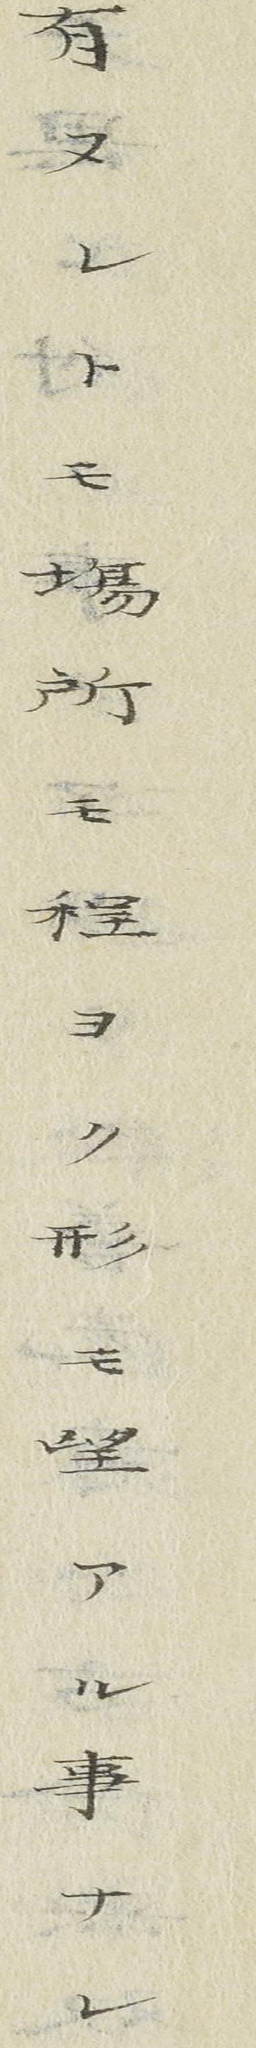有ヌレトモ場所モ程ヨク形モ望アル事ナレ
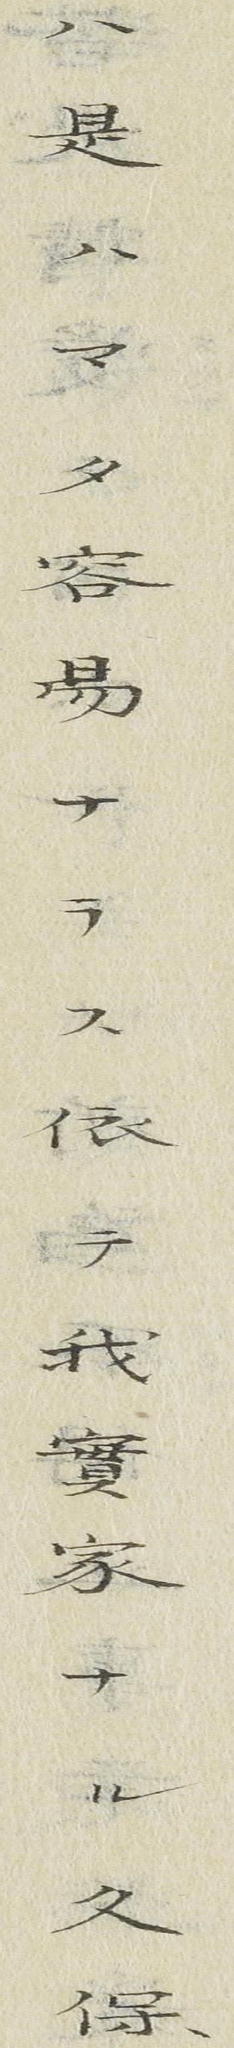ハ是ハマタ容易ナラス依テ我実家ナル久保
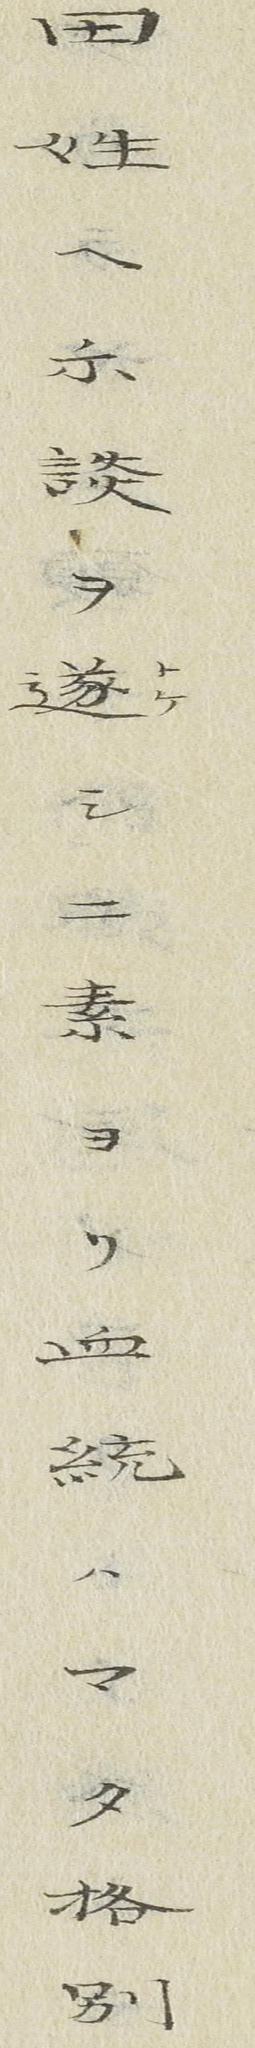田姓ヘ示談ヲ遂シニ素ヨリ血統ハマタ格別
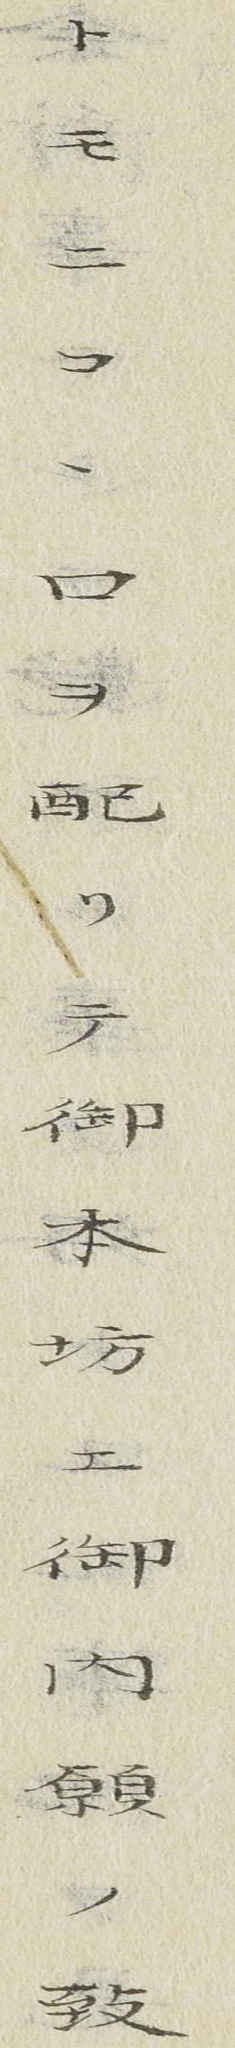トモニコヽロヲ配リテ御本坊エ御内願ノ致
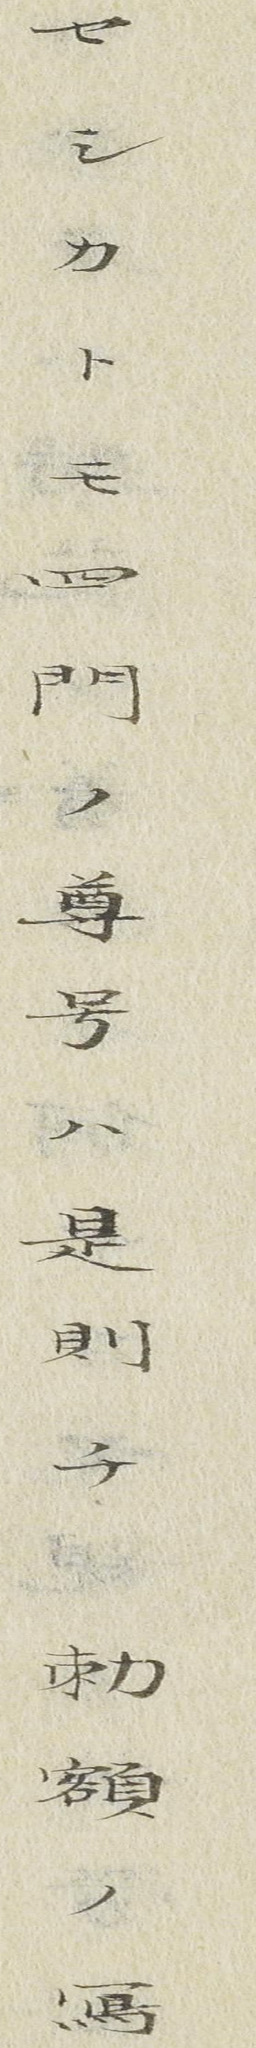セシカトモ四門ノ尊号ハ是則チ勅額ノ写
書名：地災撮要　地震之部　巻ノ二
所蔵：東京大学地震研究所図書室 Earthquake Research Institute Library, The University of Tokyo, JAPAN
